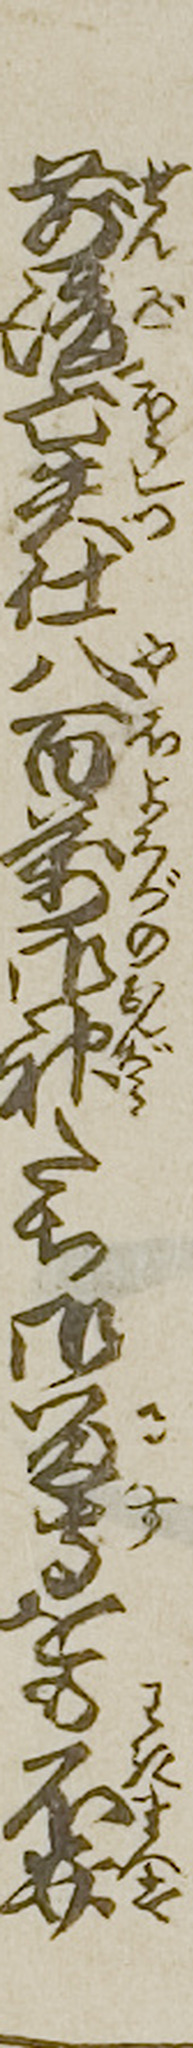前後亡失仕八百萬御神たち御留守をも不弁
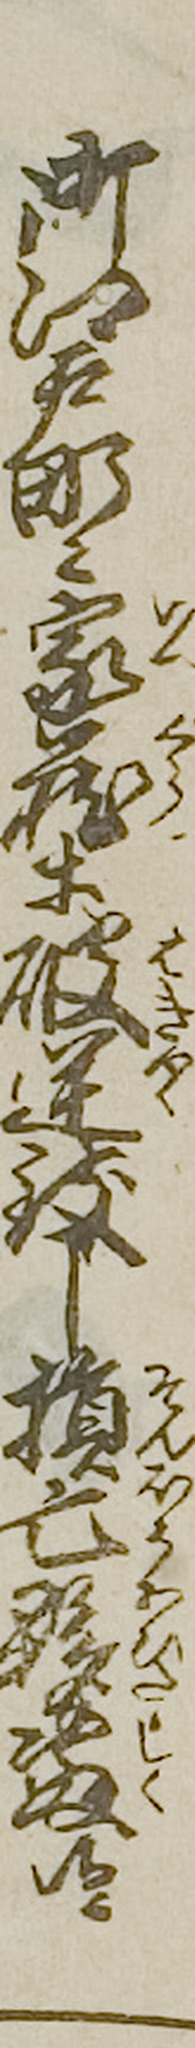御江戸町々家蔵等破逆致し損亡夥敷候二
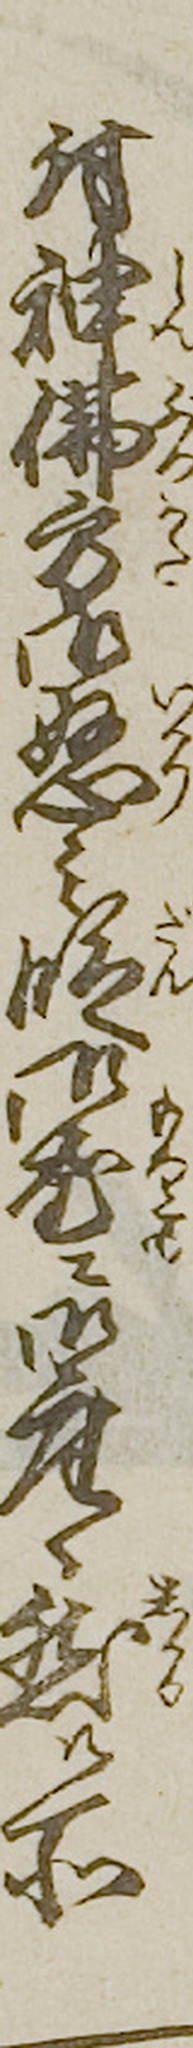付神仏方御怒之段御尤二御座候然ル所
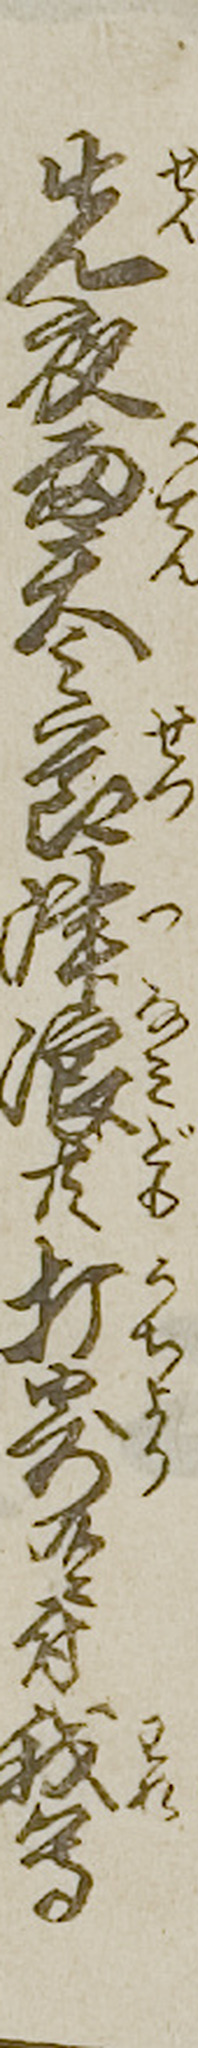先夜雨天之節津波共打寄候二付我等
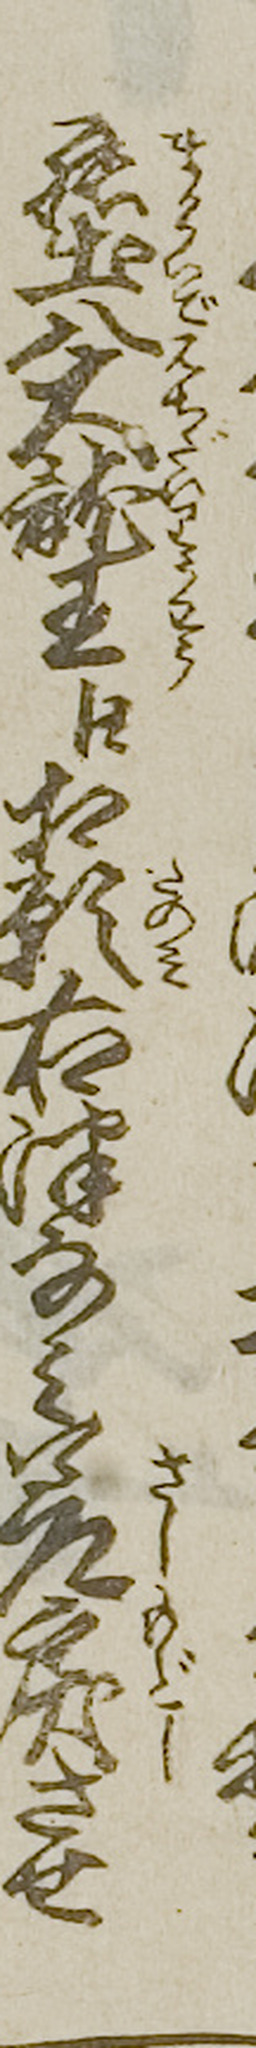罷出八大龍王江相願右津なミ差戻させ
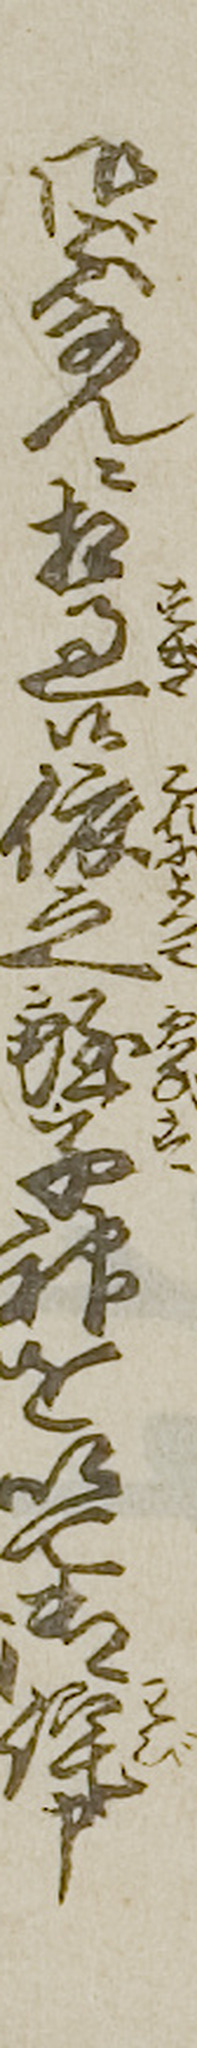御ぶなん二相過候依之蛭子神を以て御詫申
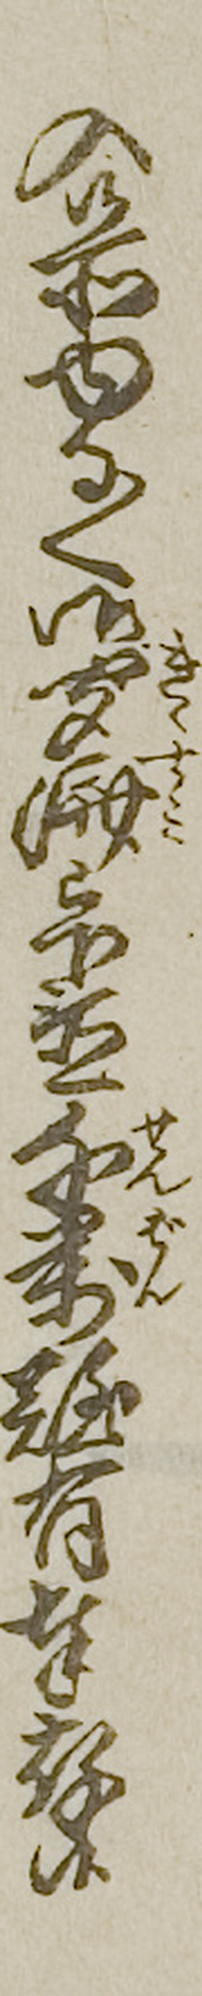入候所ゆるく御聞済被下置千萬難有奉存候
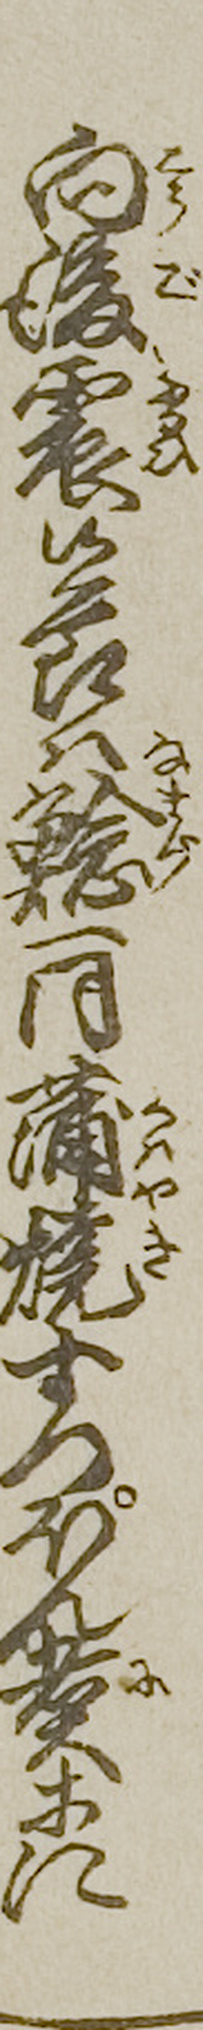向後震候節ハ鯰一同蒲焼すつぽん煮等に
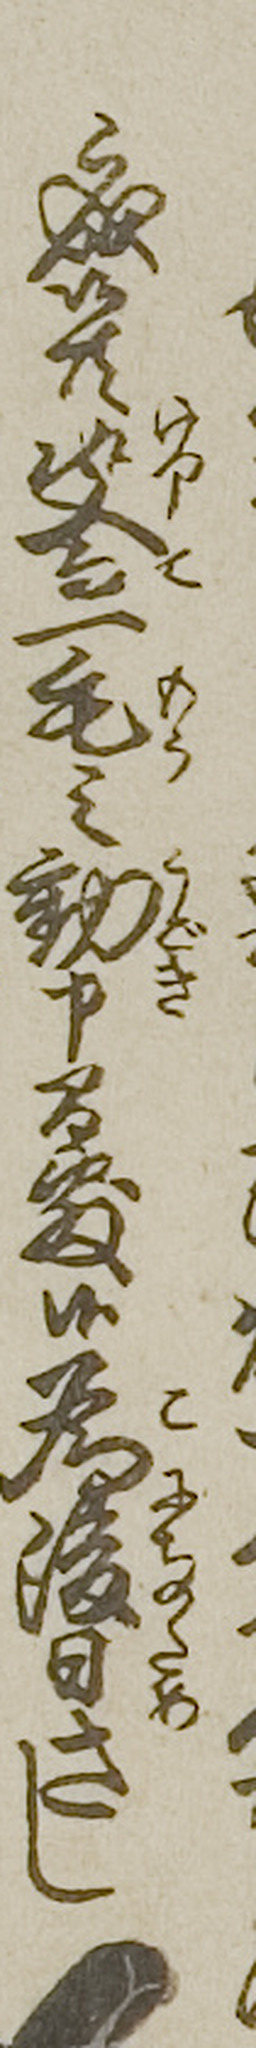被成候共決而一毛之動申間敷候為後日さし
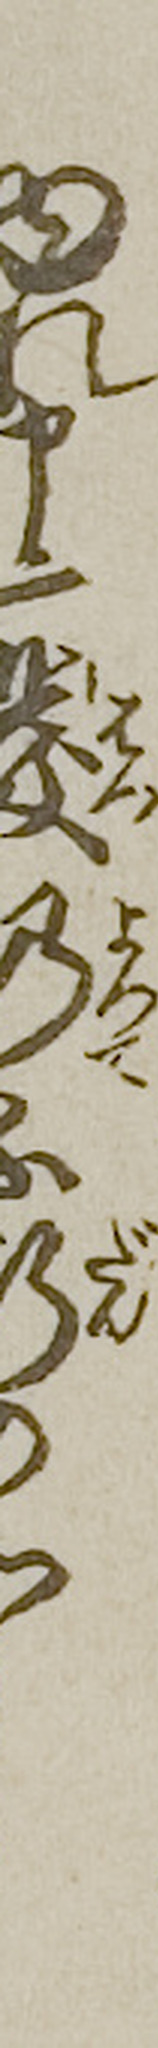ゆれ申一発仍ふ断の如し
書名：老まづ
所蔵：東京大学総合図書館 General Library in the University of Tokyo, JAPAN
